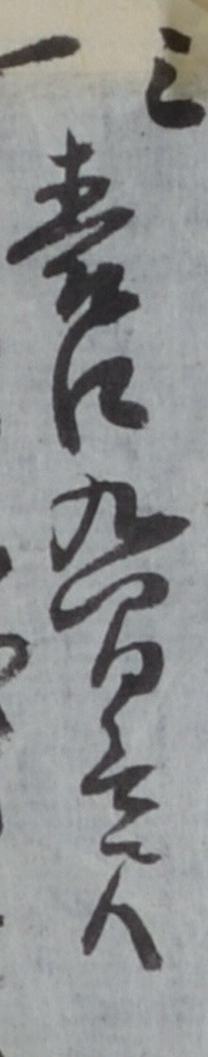一表口九間壱尺
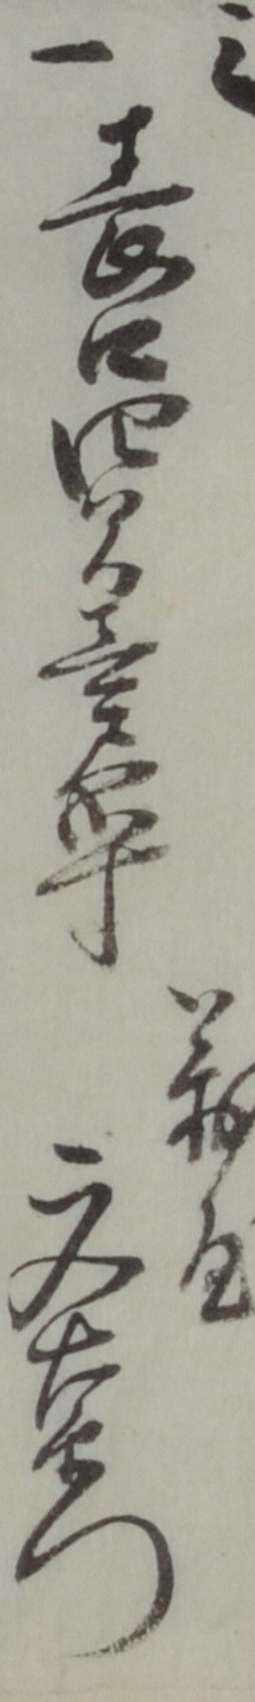一表口四間壱尺弐寸万屋
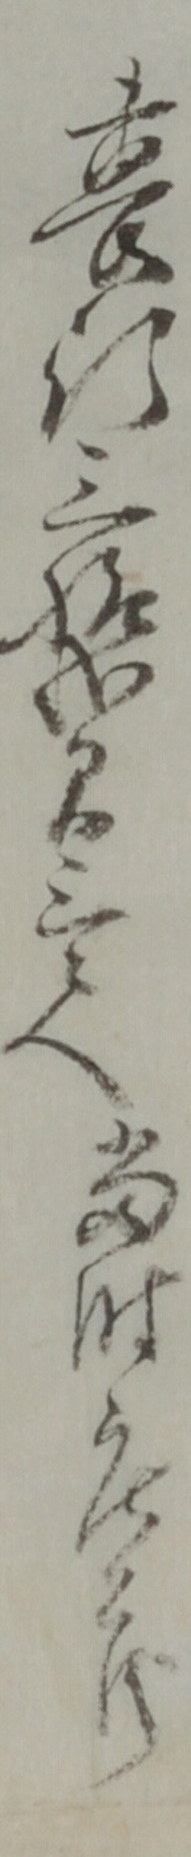裏行三拾弐間三尺文右衛門
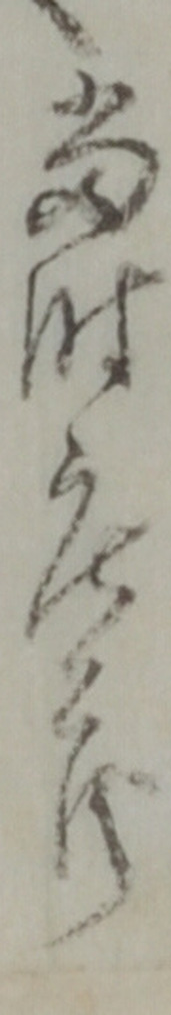当時庄蔵
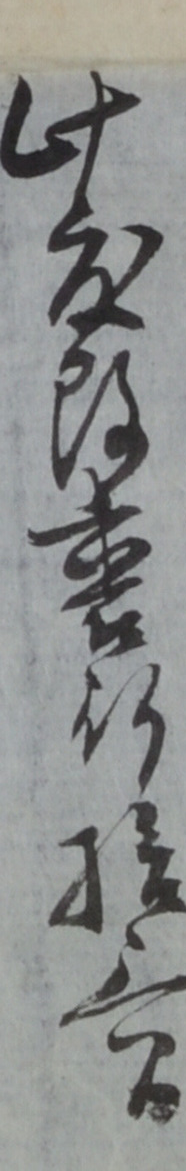此度改裏行拾三間
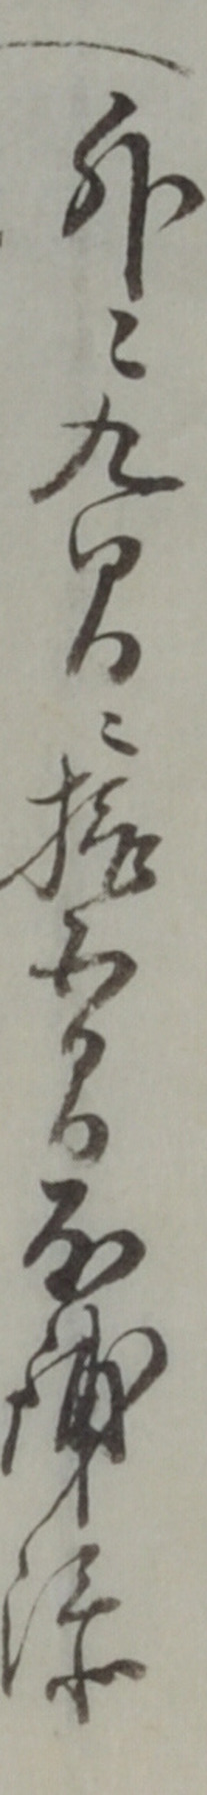外ニ九間ニ拾五間屋鋪添
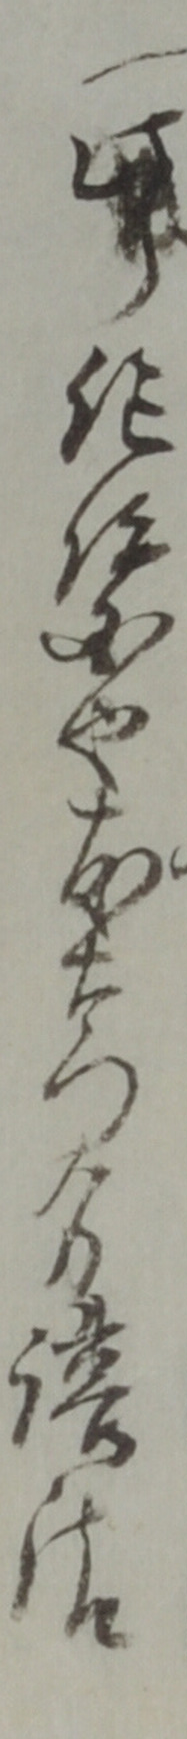此分紀伊国や友右衛門分譲請
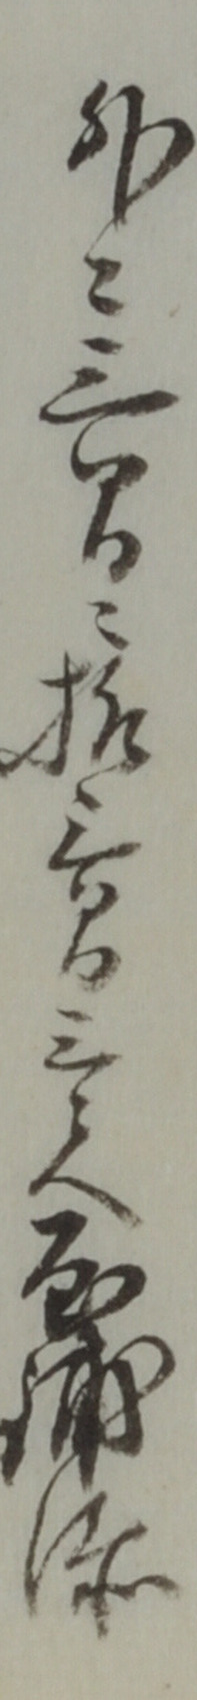外ニ三間と拾三間三尺屋鋪添
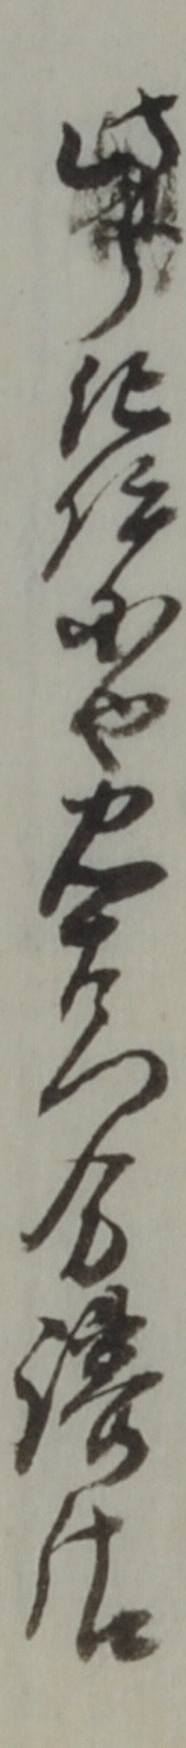此分紀伊国や忠右衛門分譲請
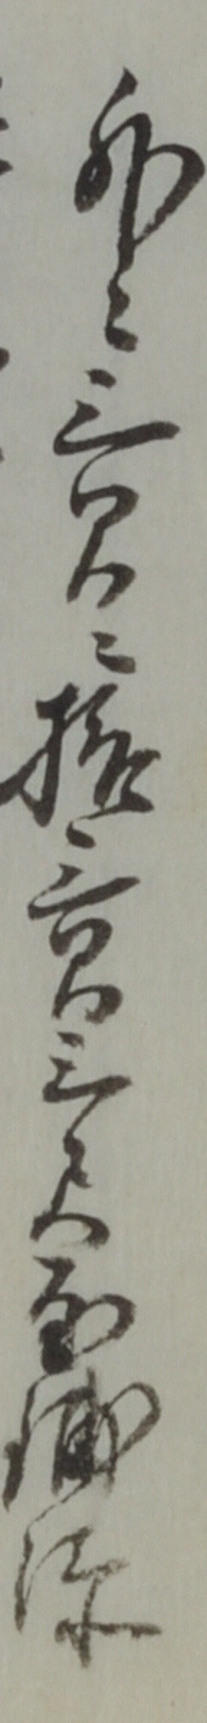外ニ三間と拾三間三尺屋鋪添
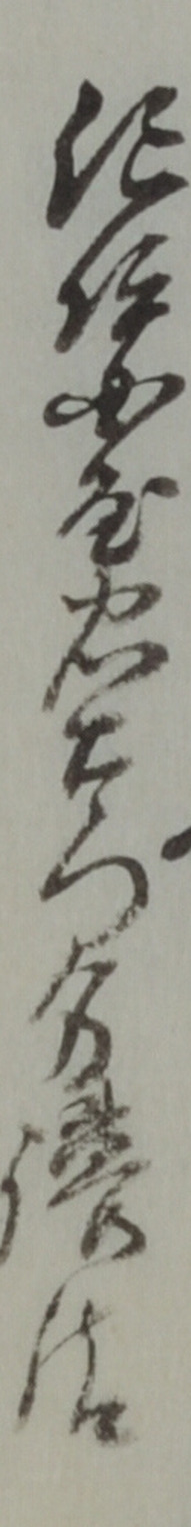紀伊国屋忠右衛門分譲請
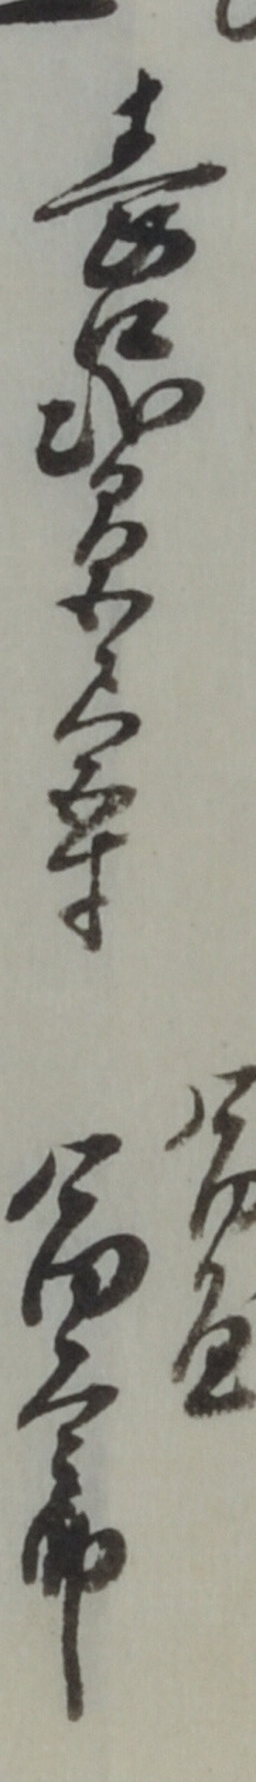一表口弐間五尺五寸冨屋
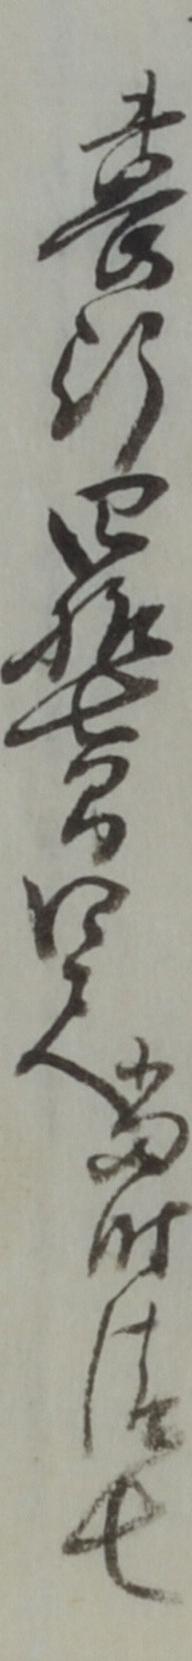裏行四拾七間四尺冨太郎
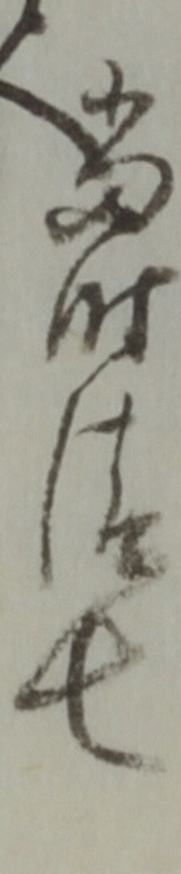当時清七
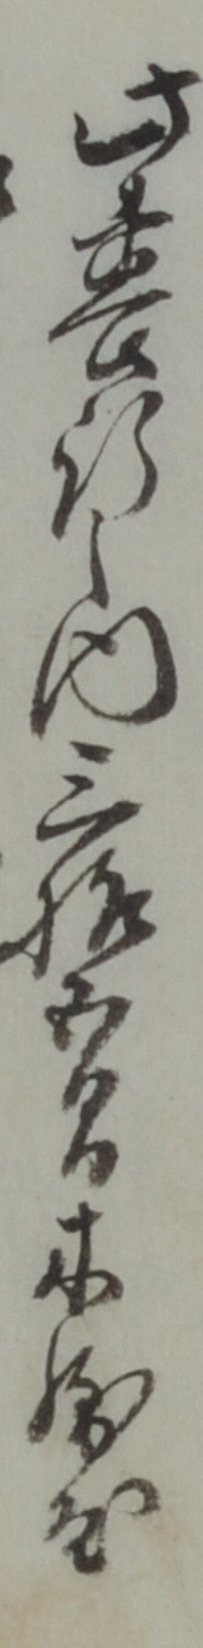此裏行之内三拾五間木綿屋
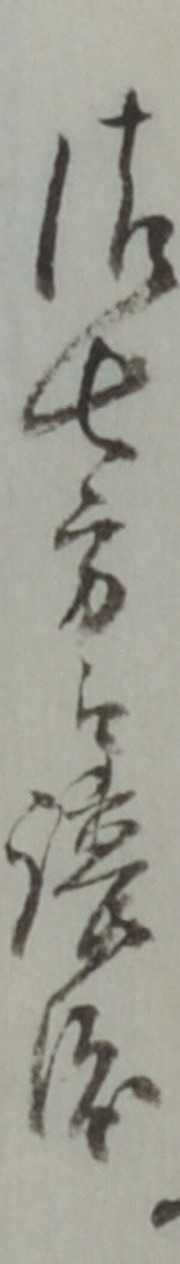清七方江譲渡
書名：屋敷表口裏行書上
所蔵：伊那市立高遠町図書館・合同会社AMANE
